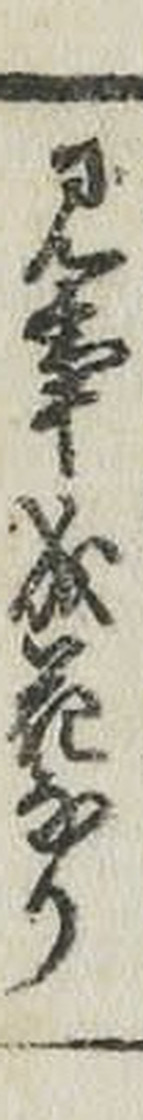見事成花なり
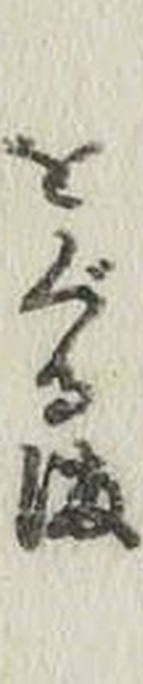をぐるま

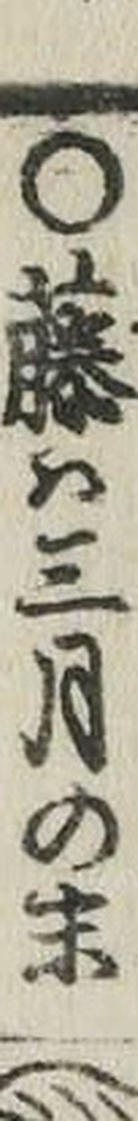○藤は三月の末
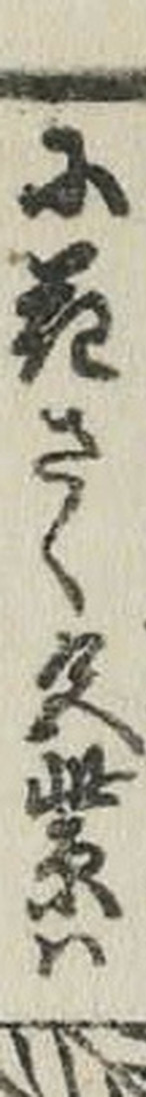に花さく色紫は
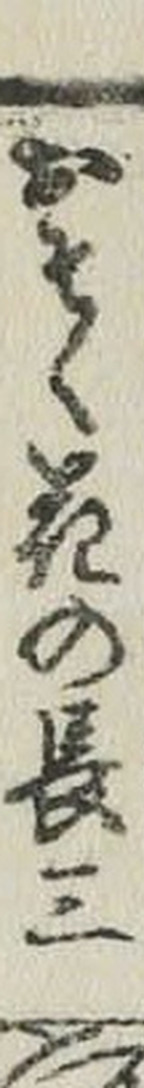おそく花の長三
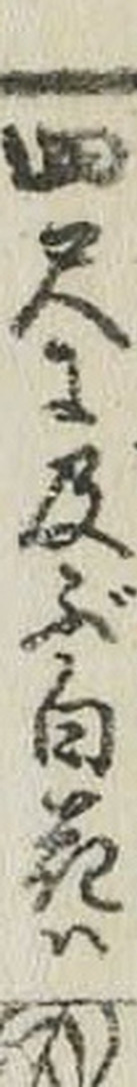四尺に及ぶ白花は
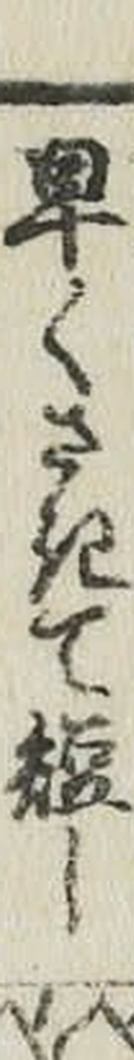早くさきて短し
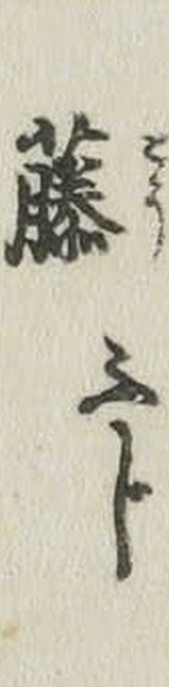藤ふじ
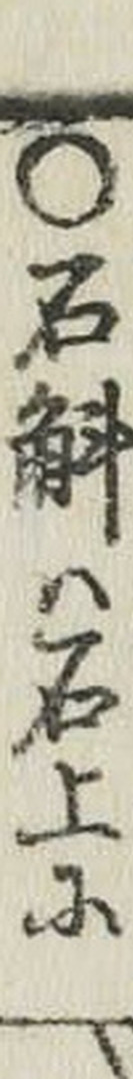○石斛は石上に
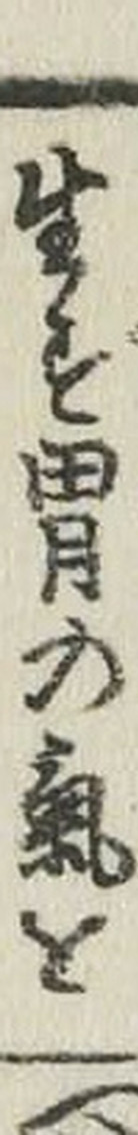生ず胃の気を
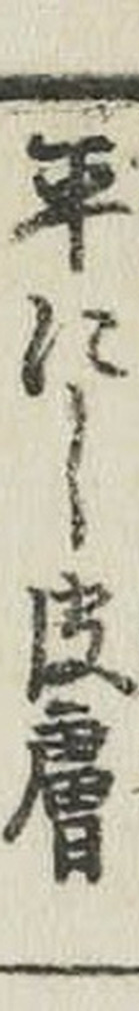平にし皮膚
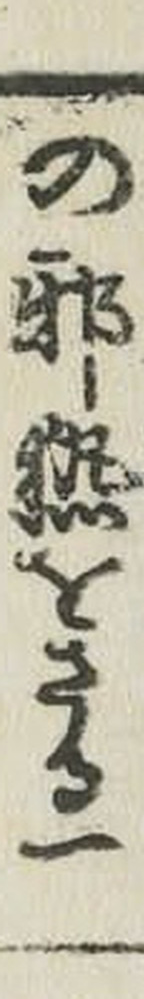の邪熱をさる一
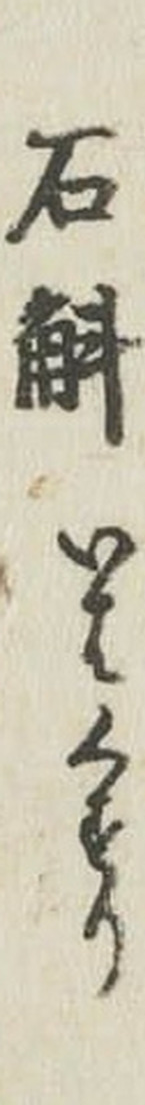石斛いはくすり
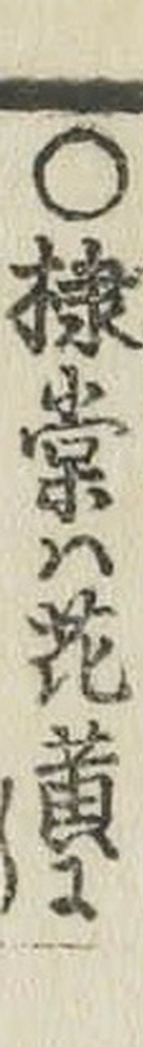○棣棠は花黄にし
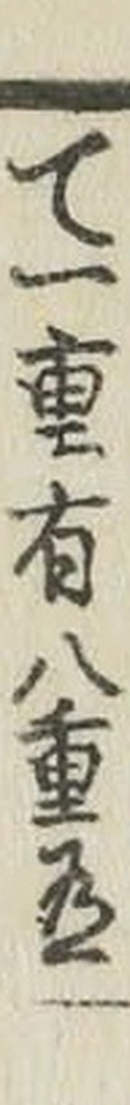て一重有八重有
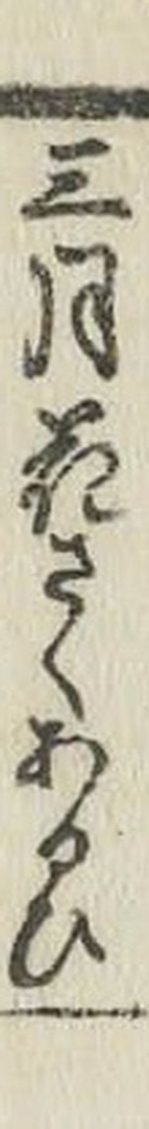三月花さくあるひ
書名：増補頭書訓蒙図彙大成 10巻 9:巻之20
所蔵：東京学芸大学教育コンテンツアーカイブ
